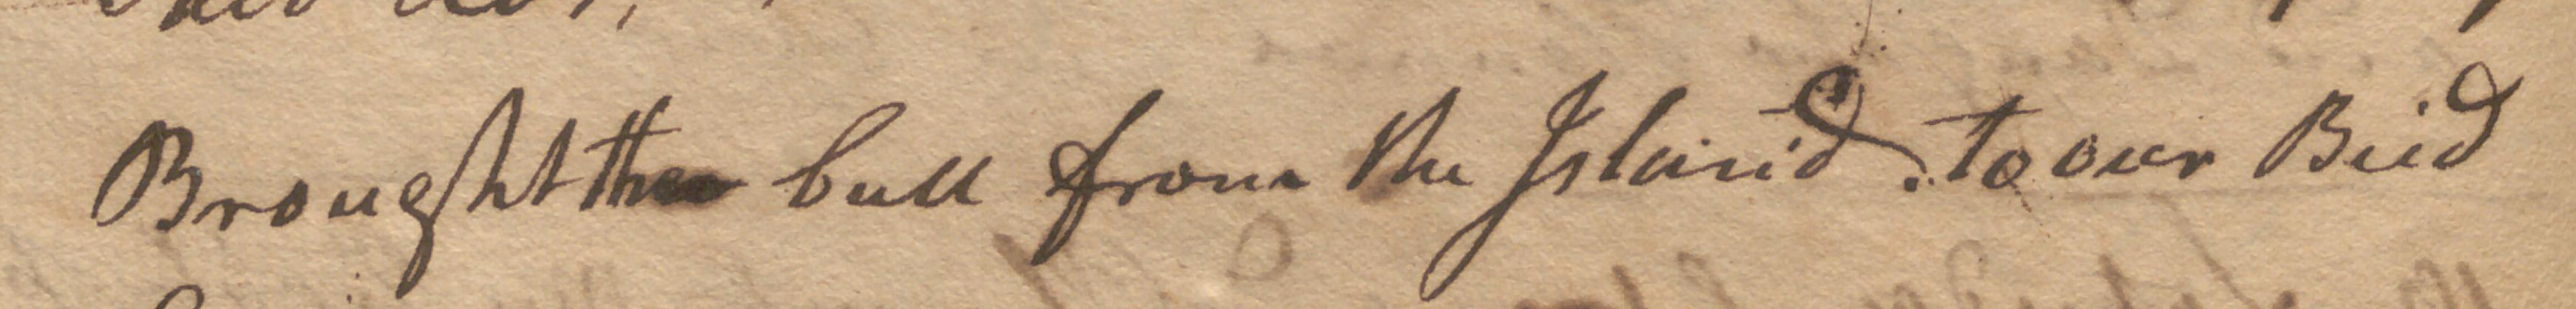Brought the bull from the Island to our Beid
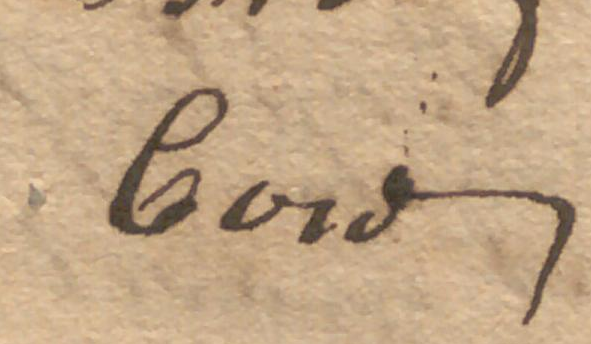Cow
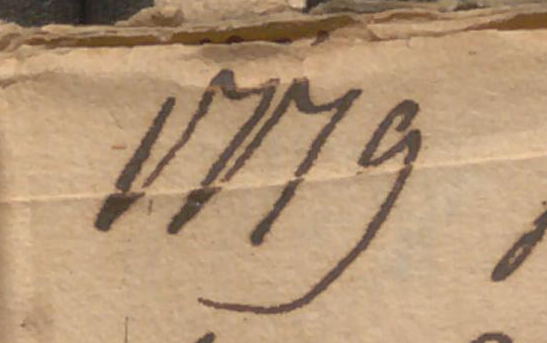1779
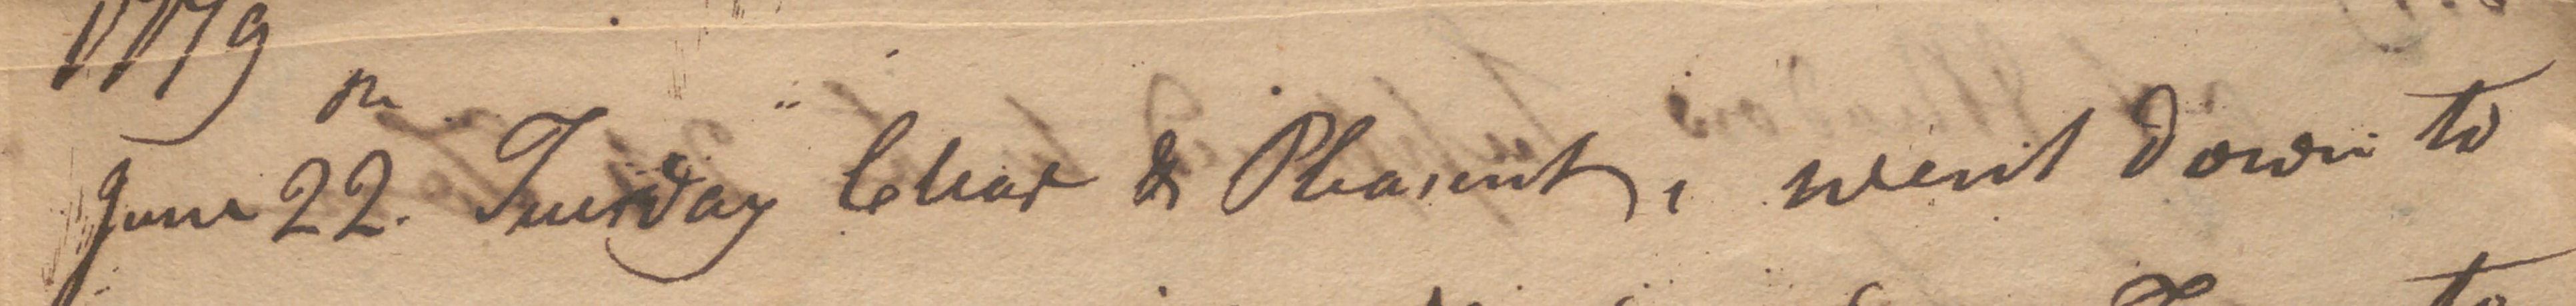June 22^th Tuesday Clear &s Pleasent, went down to
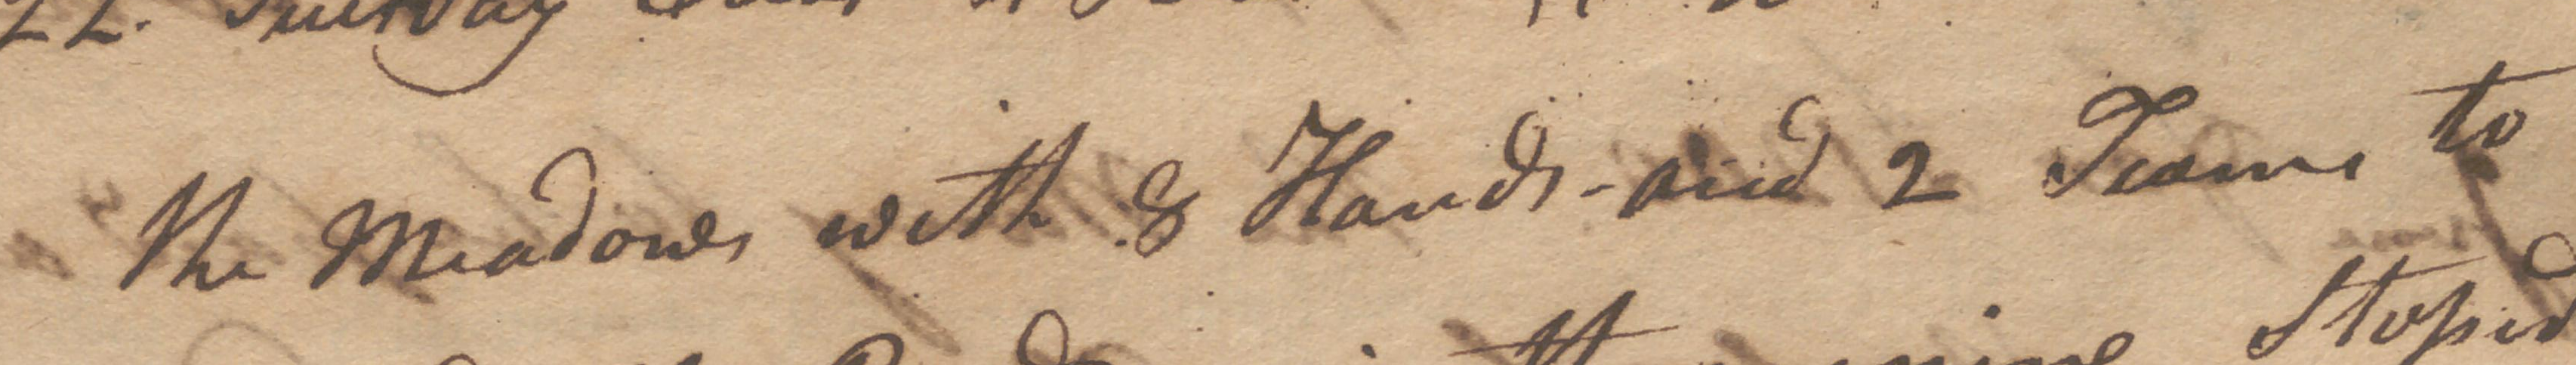the Meadows with 8 Hands and 2 Teams to
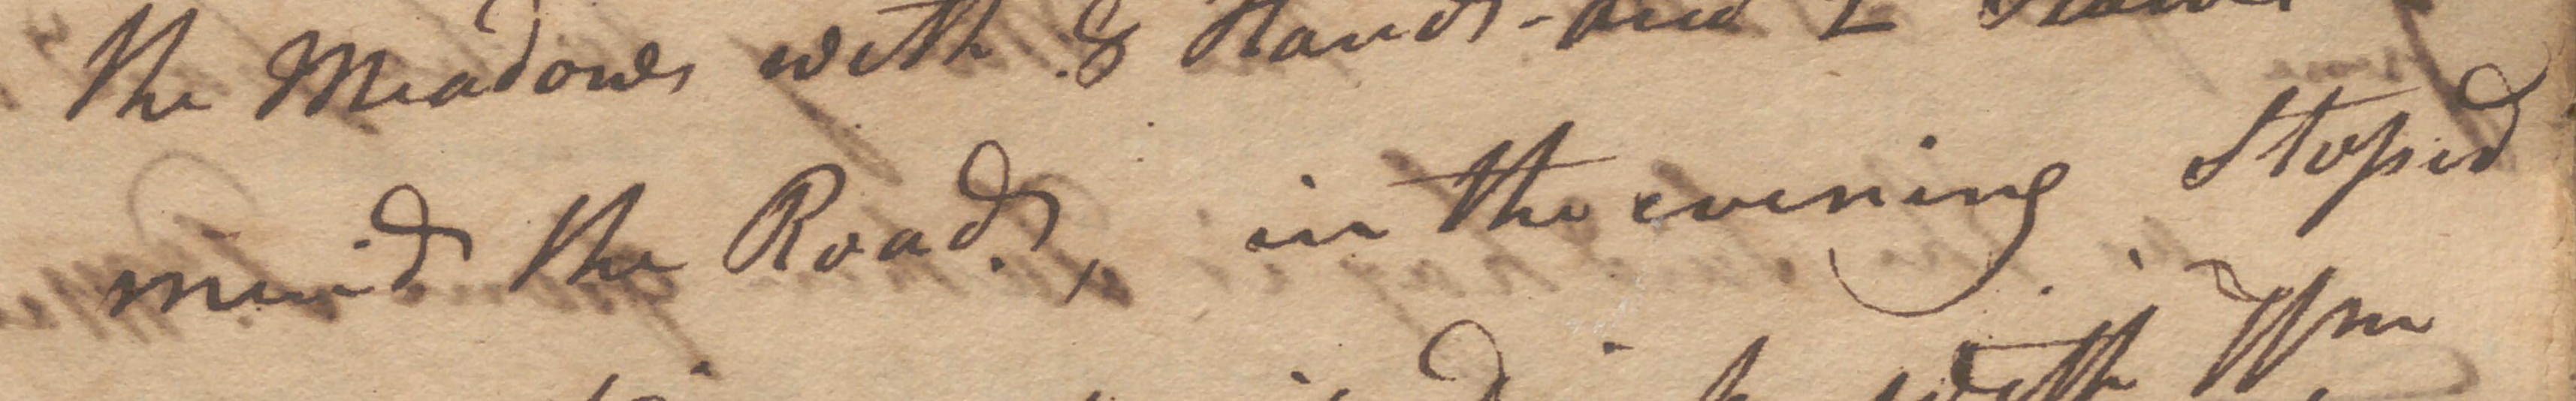mud the Roads, in the evening stoped
